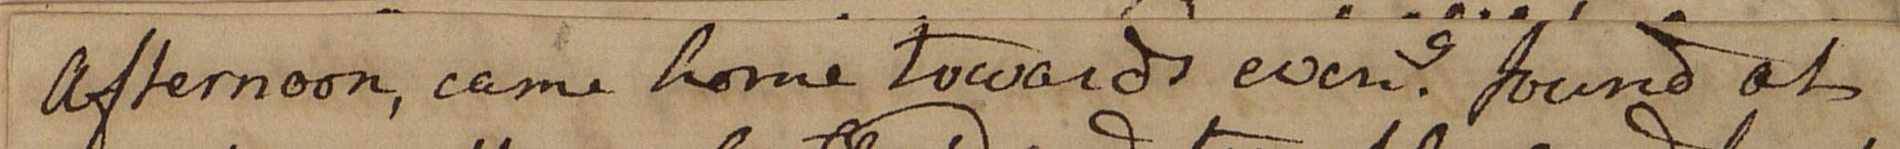Afternoon, came home towards even^g. found at
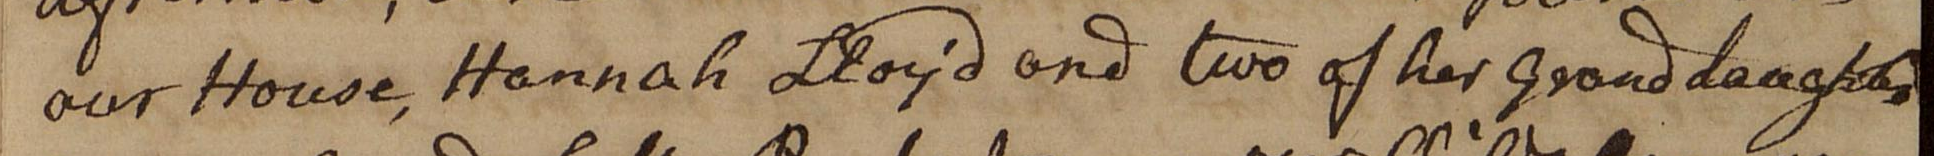our House, Hannah Lloy'd and two of her Granddaughters
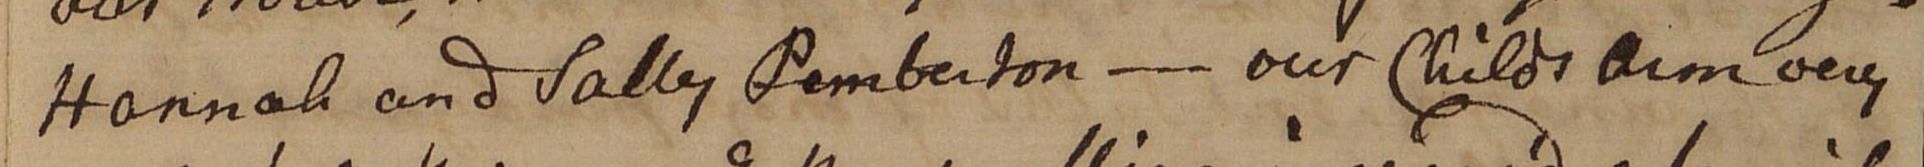Hannah and Sally Pemberton- our Childs arm very,
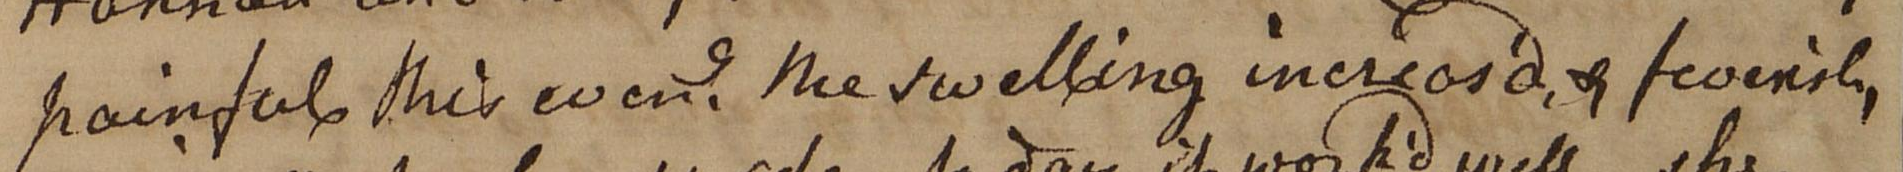painful this even^g. the swelling increas'd, & feverish,
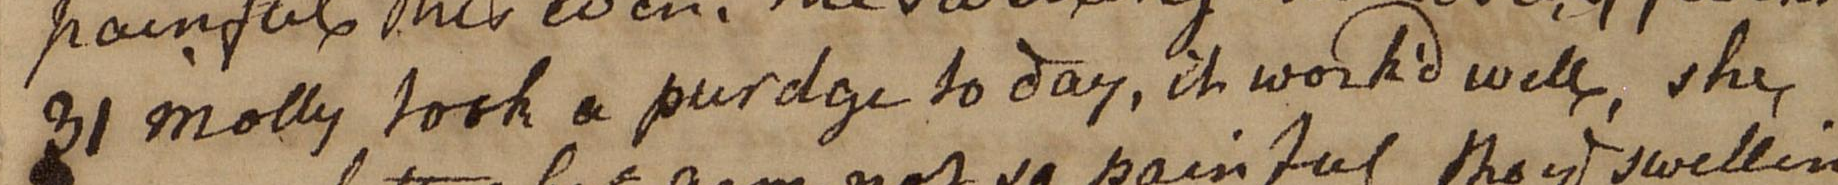31 Molly took a purdge to day, it work'd well, she
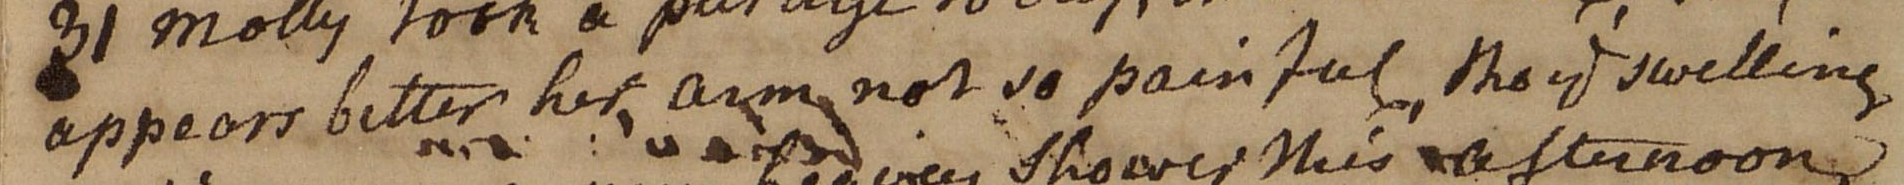appears better her arm not so painful, tho y^e swelling
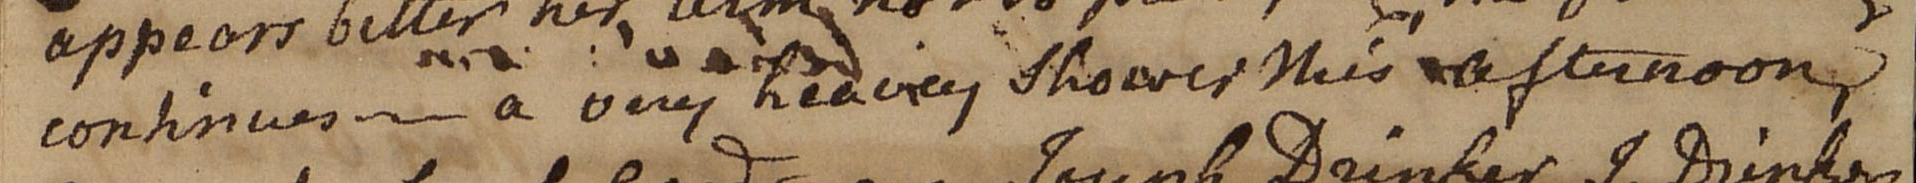continues- a very heavey Shower this afternoon,
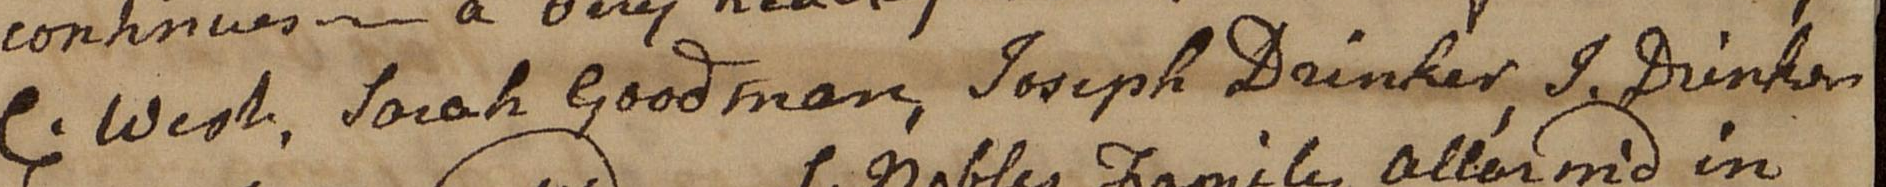C. West Sarah Goodman, Joseph Drinker, I. Drinkher
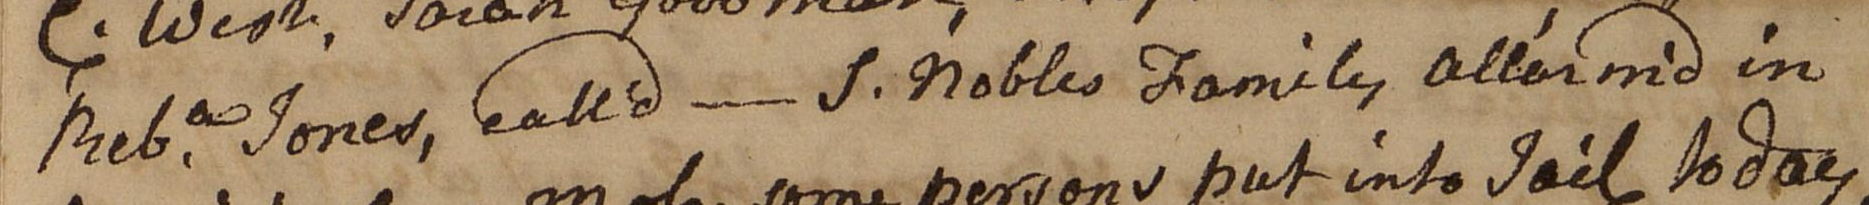Reb^a. Jones, call'd- S. Nobles Family allarm'd in
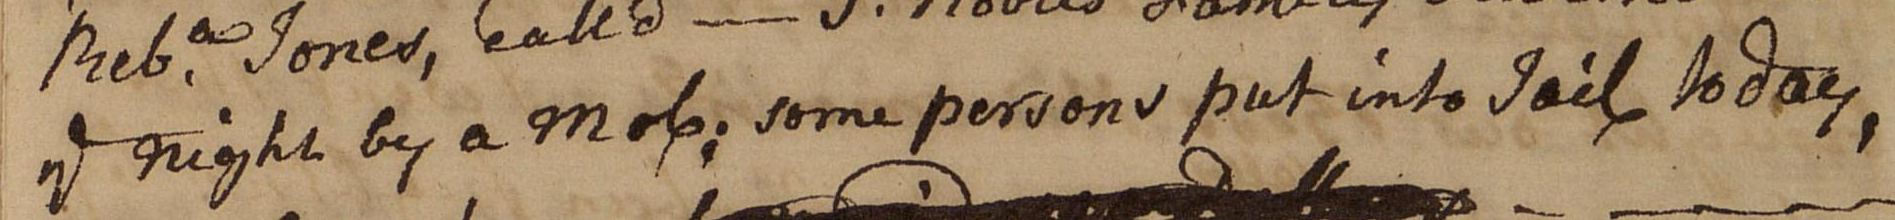y^e night by a mob; some persons put into Jail today,
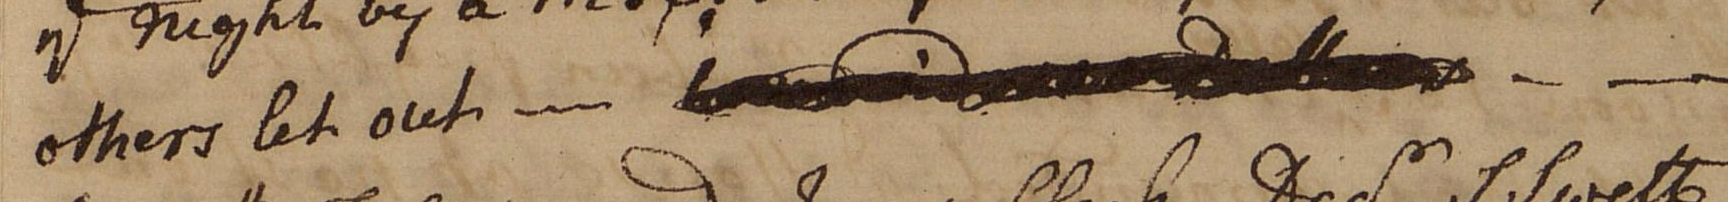others let out- [_________________]--
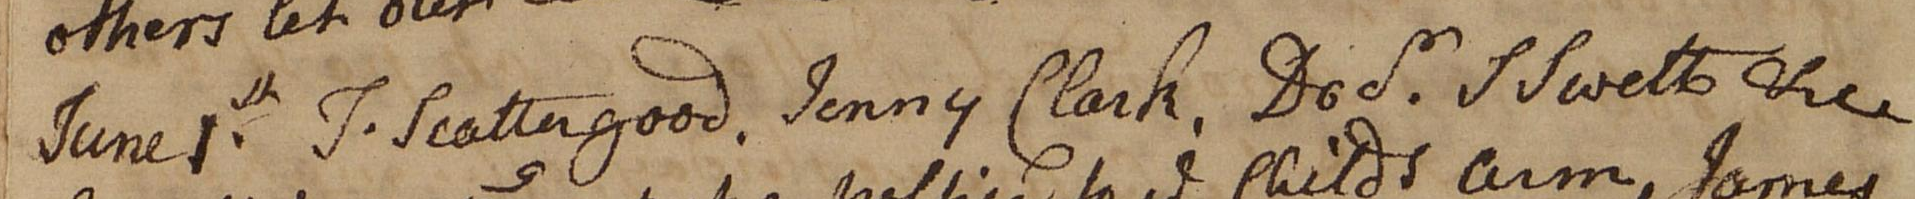June 1^st. T. Scattergood, Jenny Clark, Doc^r. S Swett &c
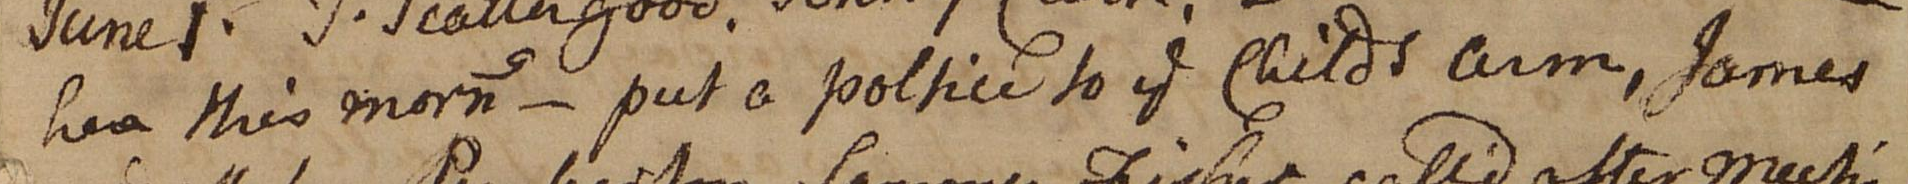here this morn^g- put a poltice to y^e Childs Arm, James
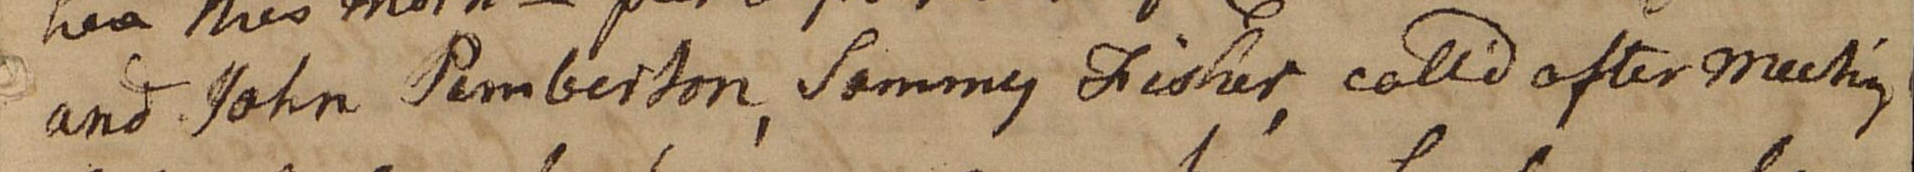and John Pemberton, Sammy Fisher, call'd after meetig
